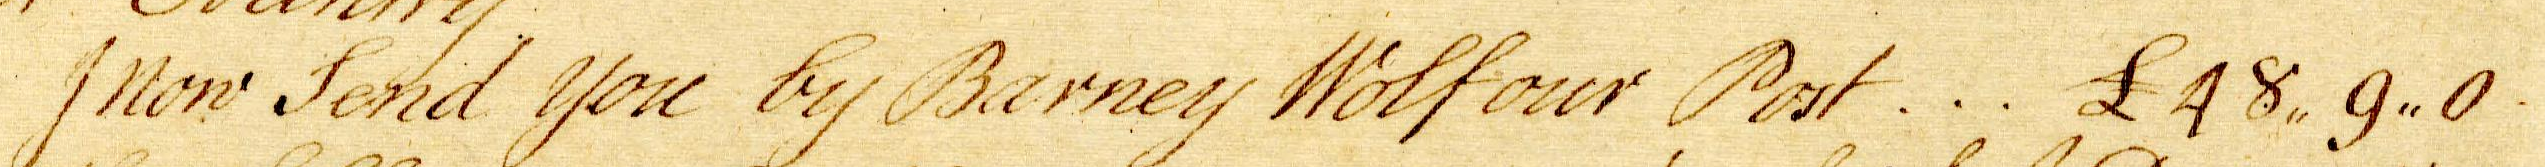I now Send you by Barney Wolf our Post... £48..9..0
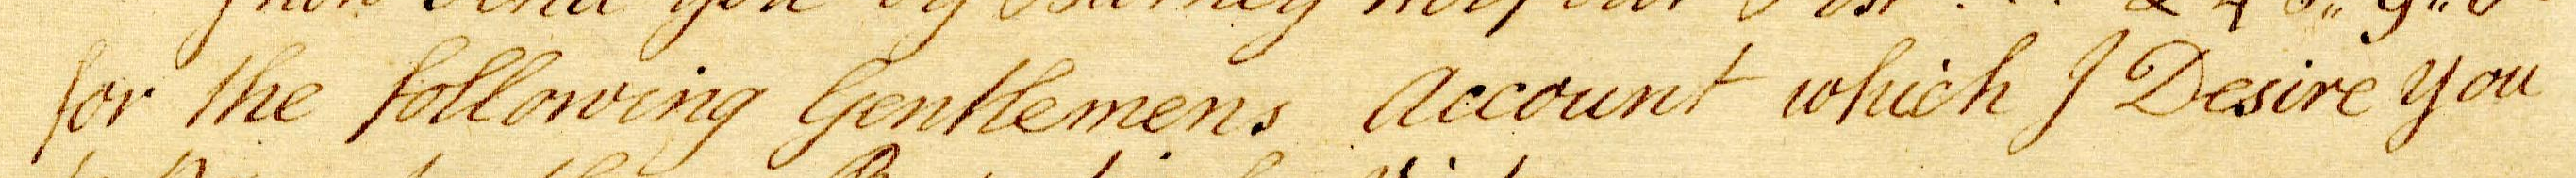for the following Gentlemens Account which I Desire you
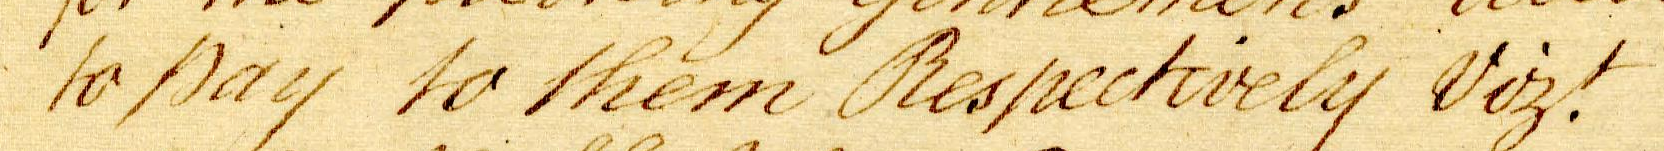to Pay to them Respectively Viz^t.
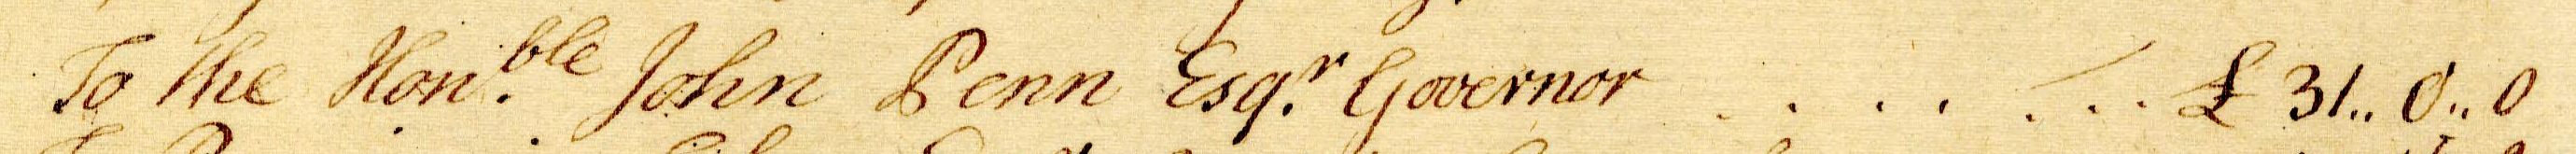To the Hon.^ble John Penn Esq^r. Governor....... £31..0..0
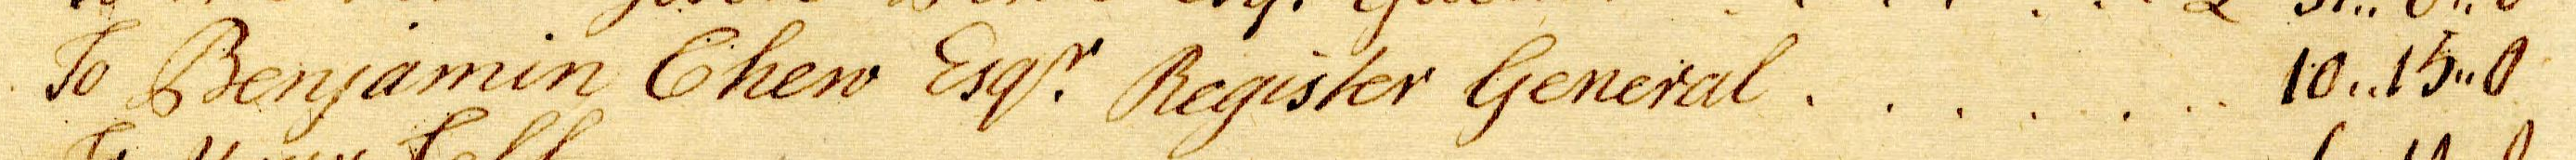To Benjamin Chew Esq^r. Register General........10..15..0
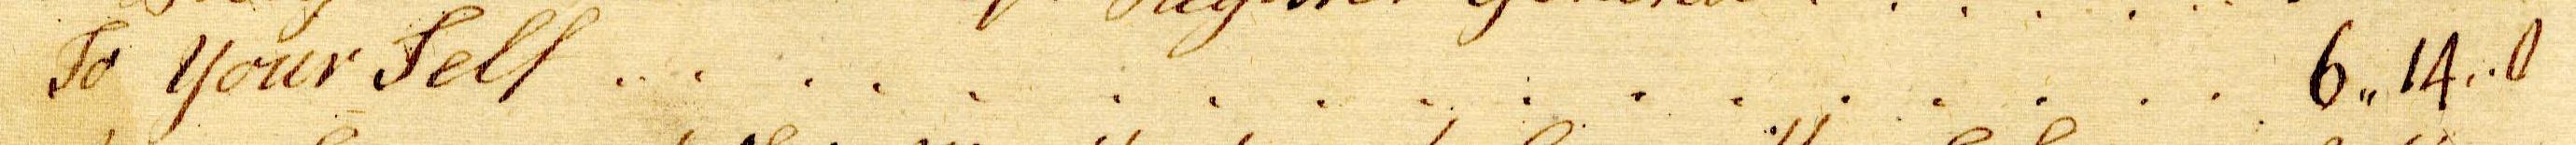To Your Self ..................6..11..0
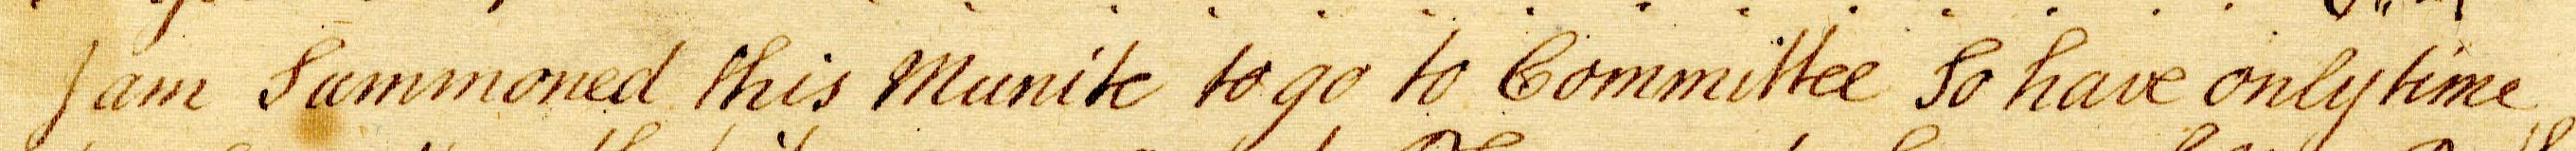I am Summoned this Munite to go to Committee So have only time
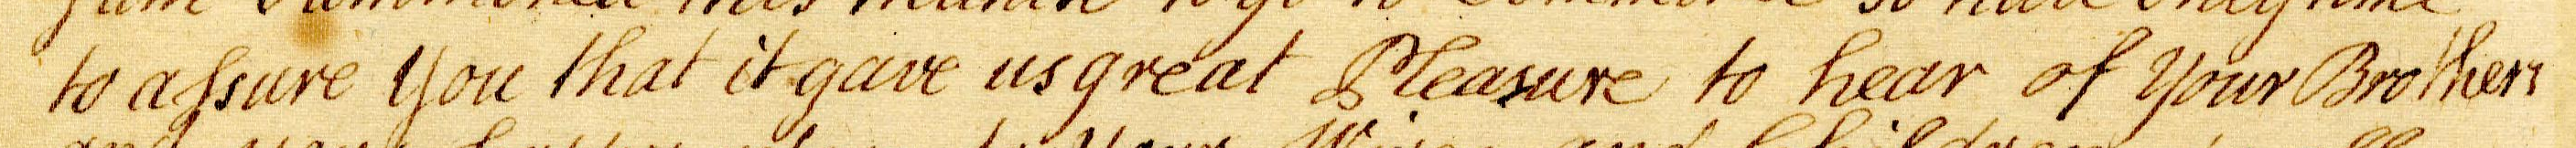to assure You that it gave us great Pleasure to hear of Your Brothers
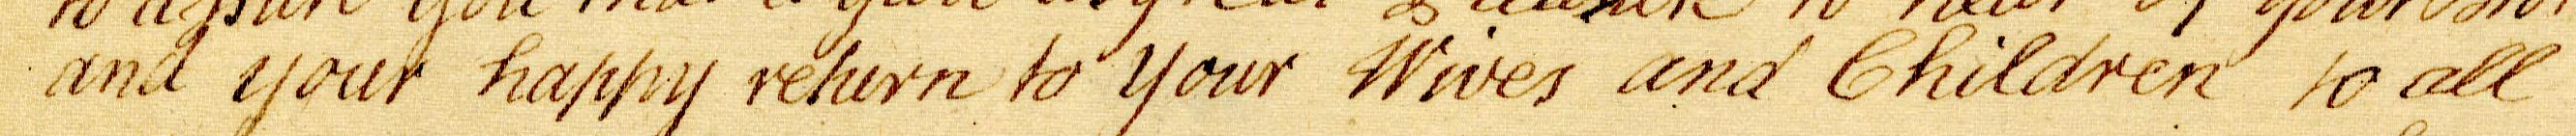and Your happy return to Your Wives and Children to all
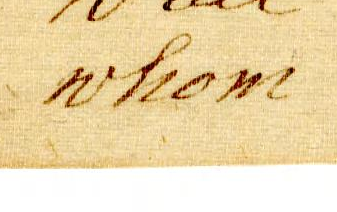whom
